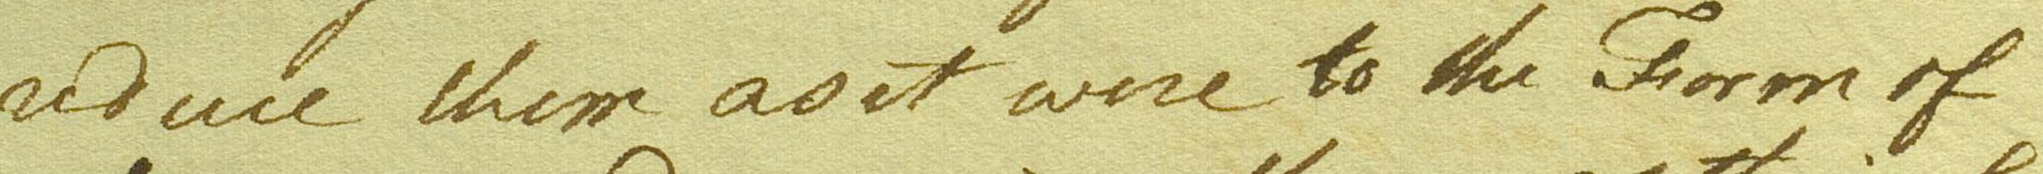reduce them as it were to the Form of
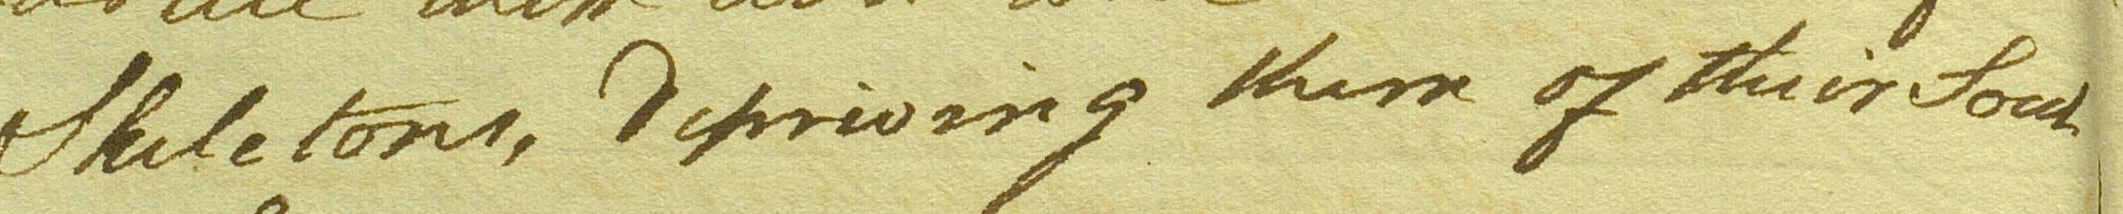Skeletons, depriving them of their Soul
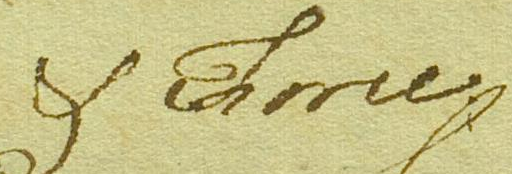& Force.
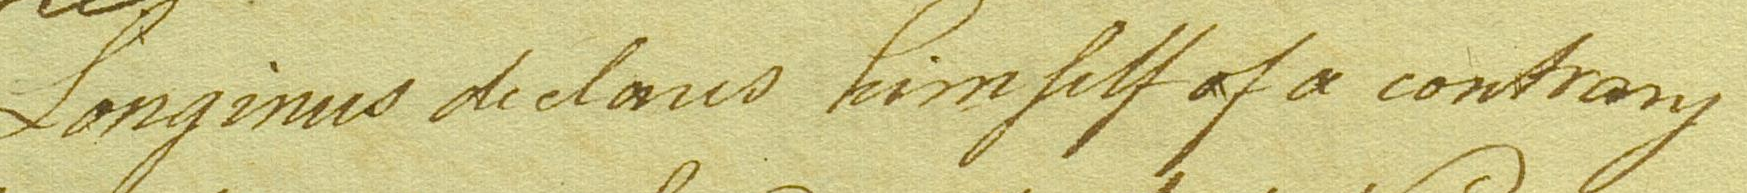Longinus declares himself of a contrary
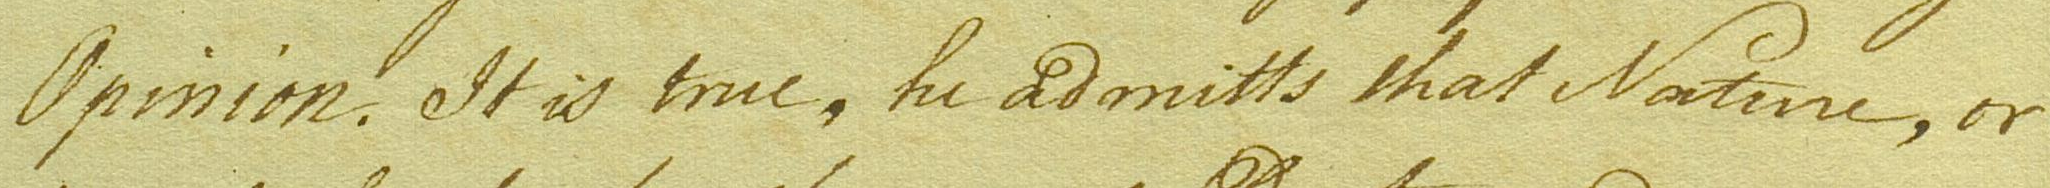Opinion. It is true, he admits that Nature, or
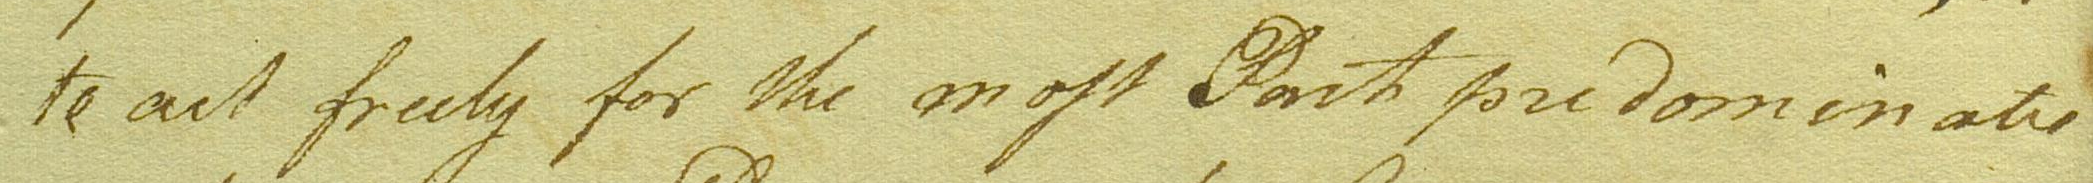to act freely for the most Part predominates
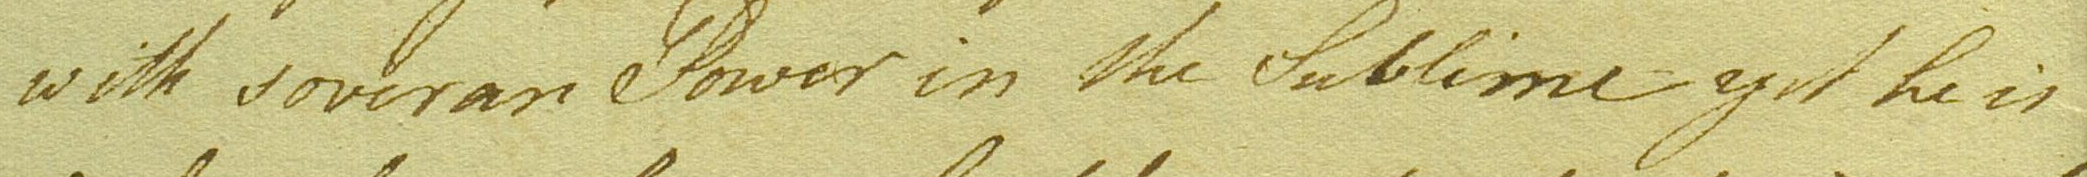with soveran Power in the Sublime yet he is
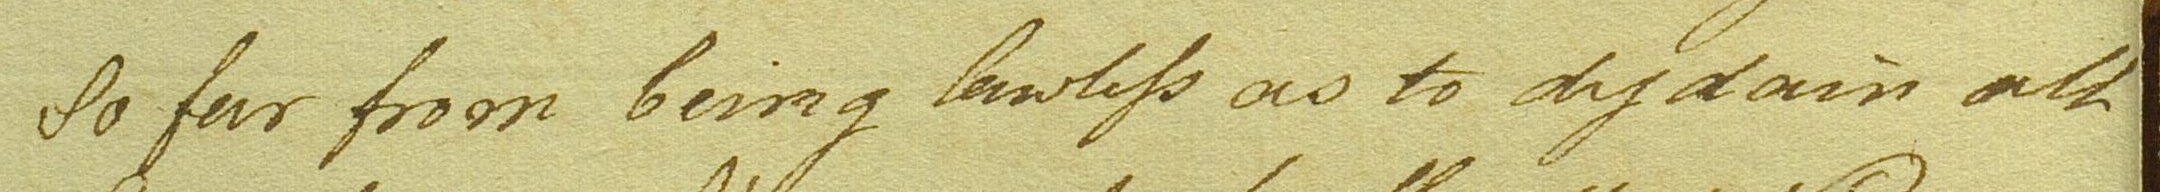so far from being lawless as to disdain all
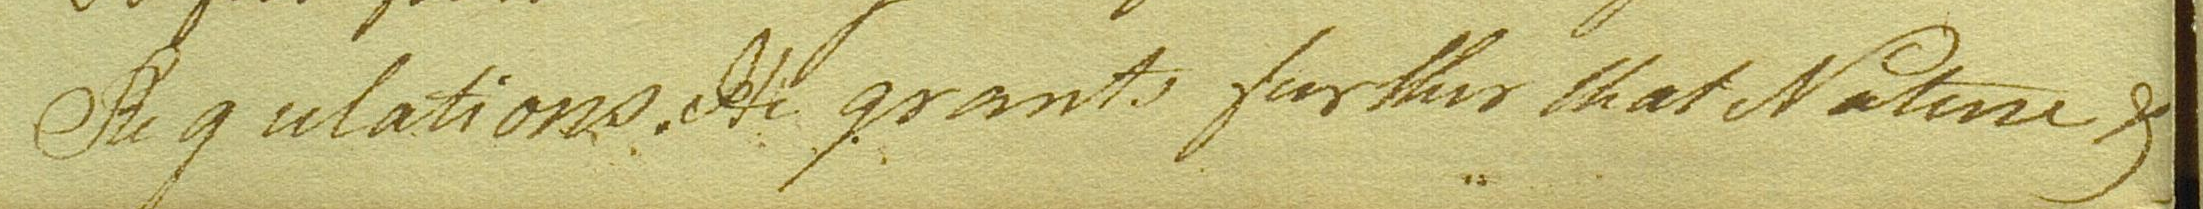Regulations. He grants further that Nature &
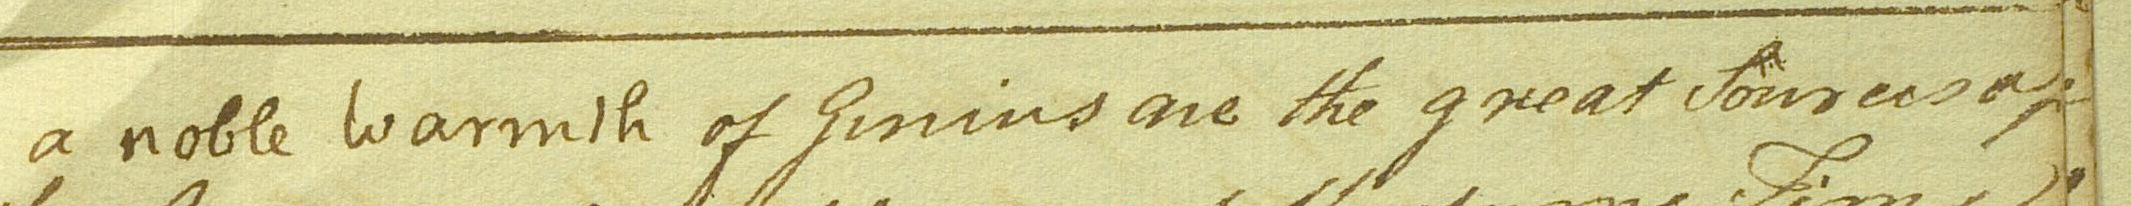a noble warmth of Genius are the great Sources of
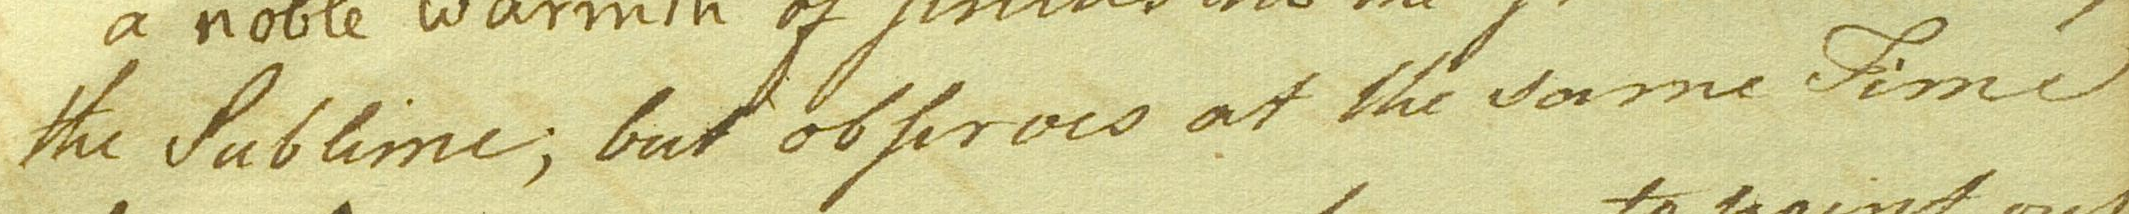the Sublime; but observes at the same Time
